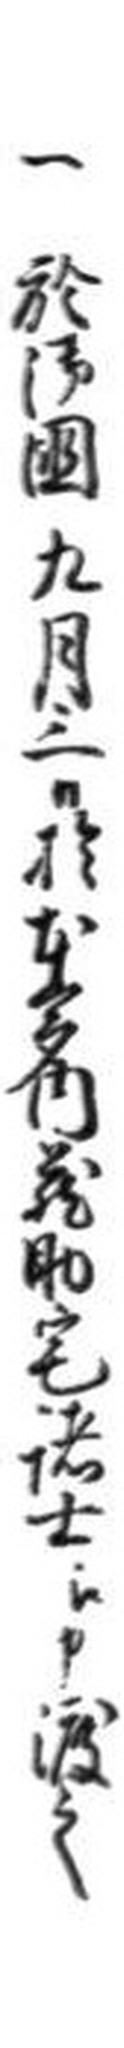一於御国九月三日於本多内蔵助宅諸士江申渡之
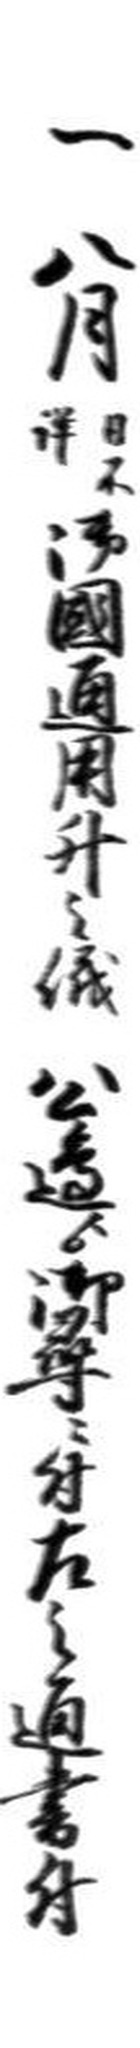一八月日不詳御国通用升之儀公辺ゟ御尋ニ付左之通書付
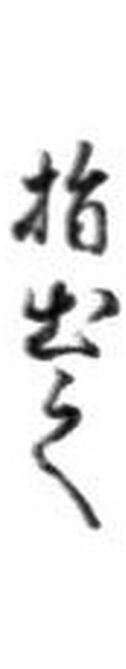指出之
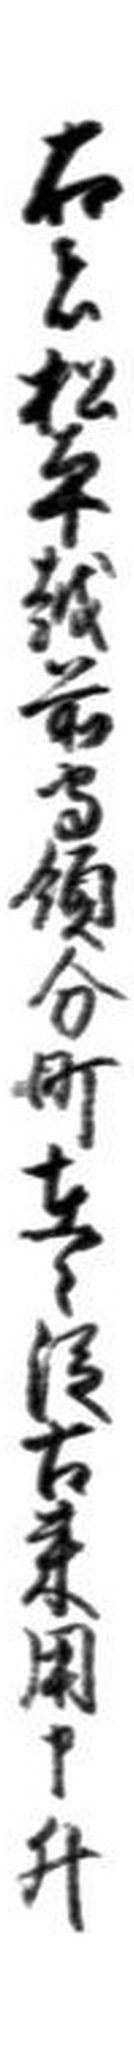右者松平越前守領分町在々従古来用申升
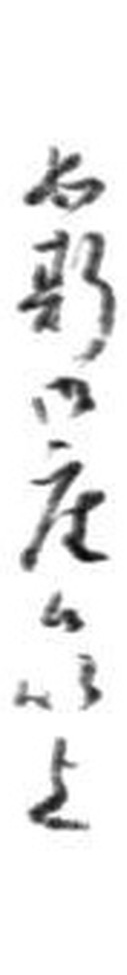如斯御座候以上

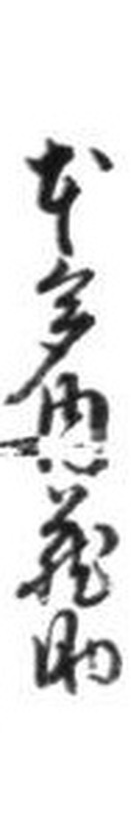本多内蔵助
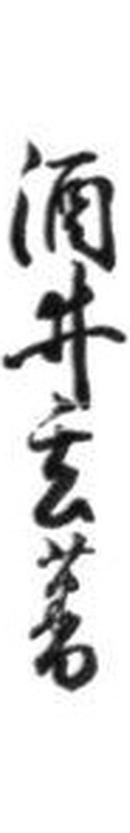酒井玄蕃
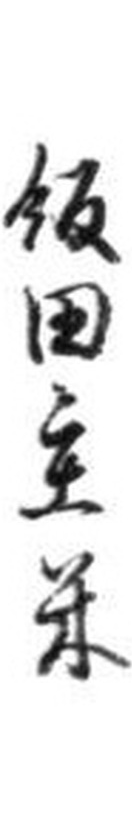飯田主米
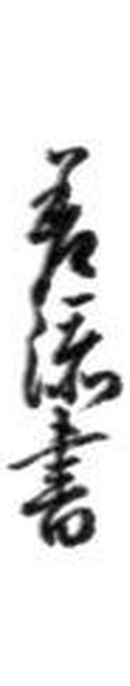差添書
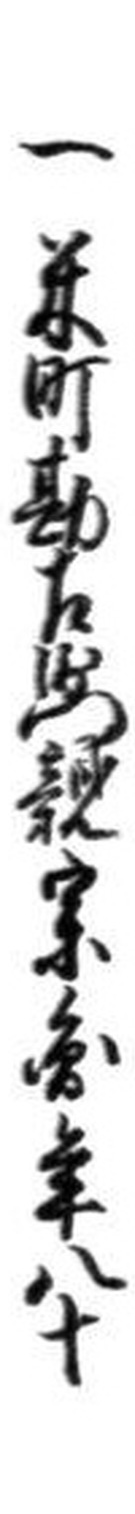一米町勘左衛門親宗円年八十
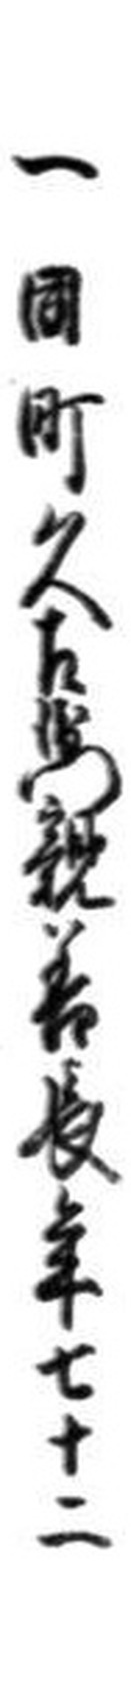一同町久左衛門親善長年七十二
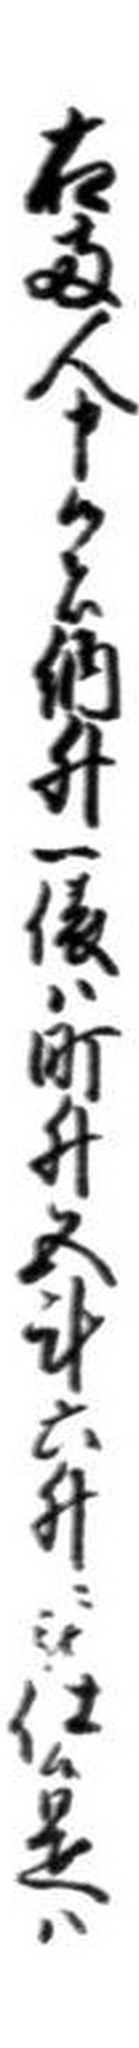右両人申候者納升一俵ハ町升五斗六升ニ被仕候是ハ
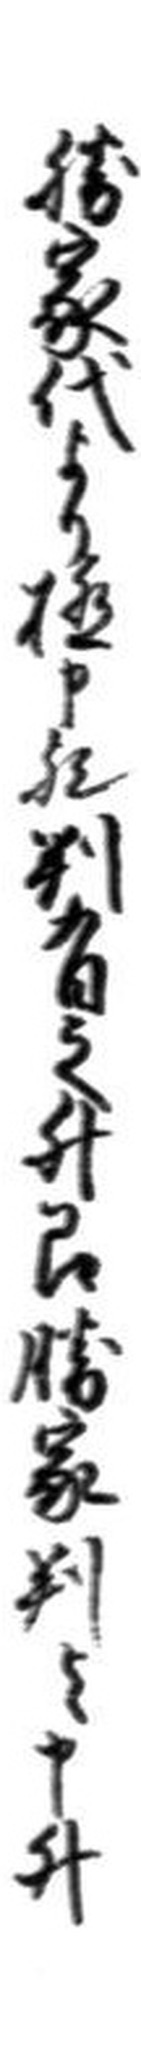勝家代より極申歟判有之升即勝家判と申升
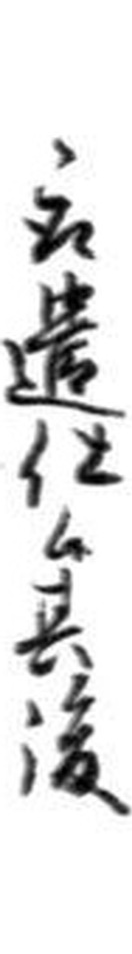取遣仕候其後
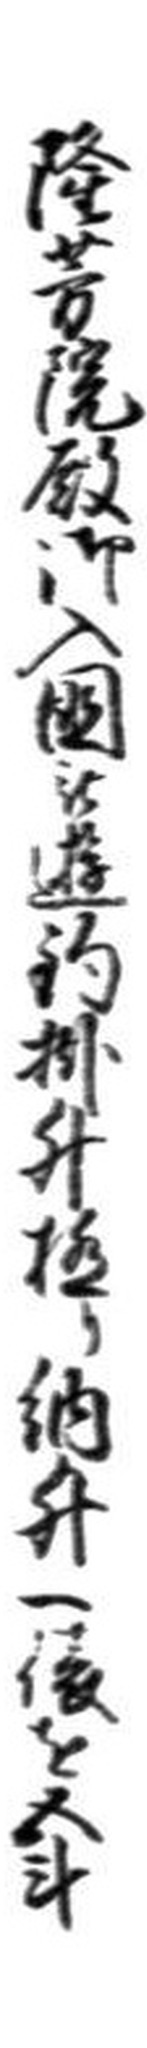隆芳院殿御入国被遊釣掛升極リ納升一俵を五斗
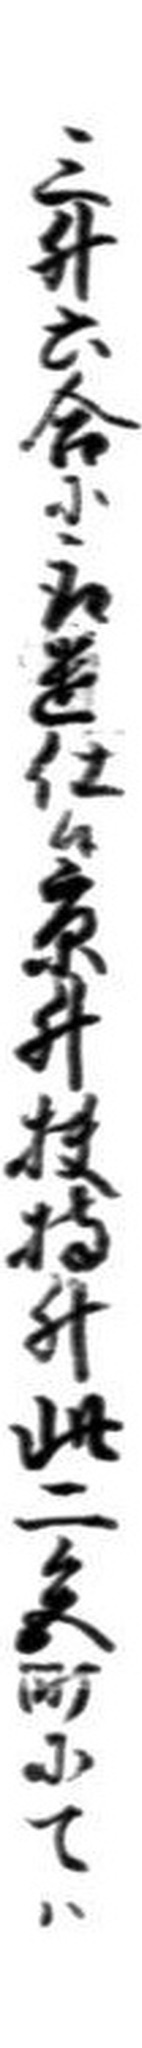三升六合に取遣仕候京升扶持升此ニ色町にてハ
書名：家譜 七 光通公 従寛文四年到同九年
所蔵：福井県文書館 Fukui Prefectural Archives
